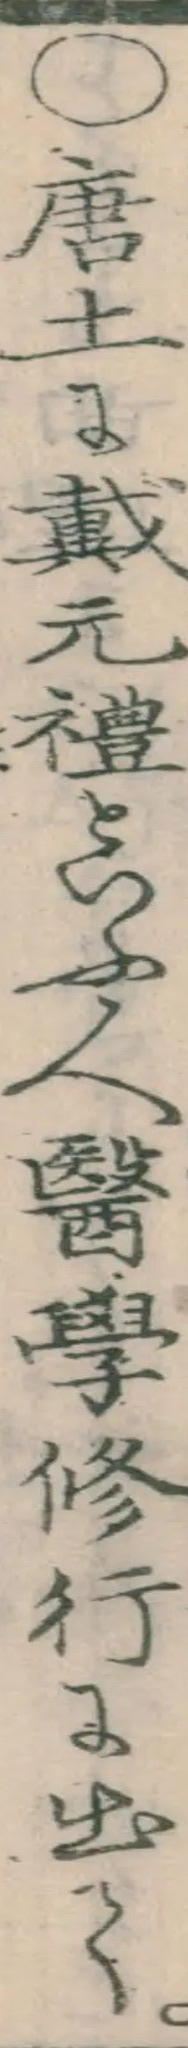〇唐土に戴元禮といふ人。醫学修行に出て。
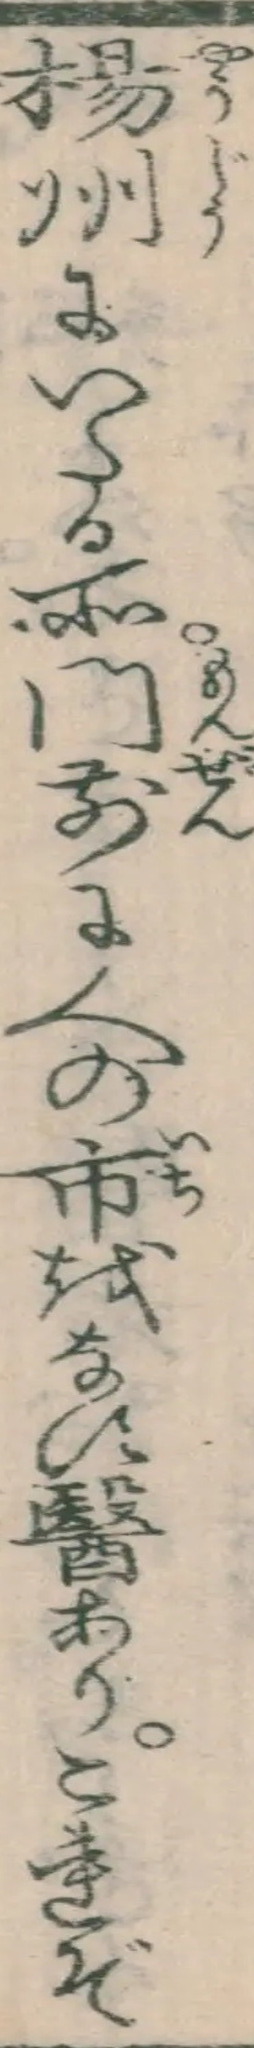楊州にいたる所。門前に人の市をなす醫あり。これぞ
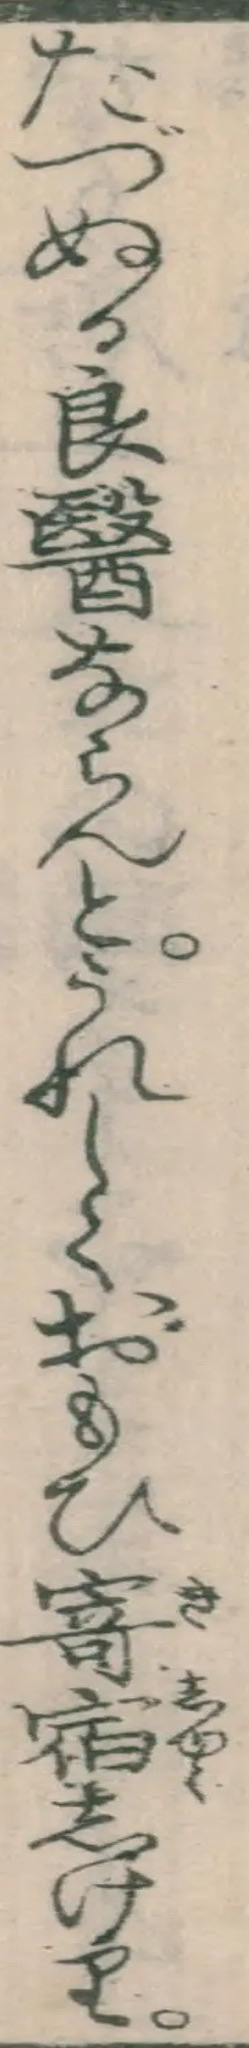たづぬる良醫ならんと。うれしくおもひ寄宿しけり。
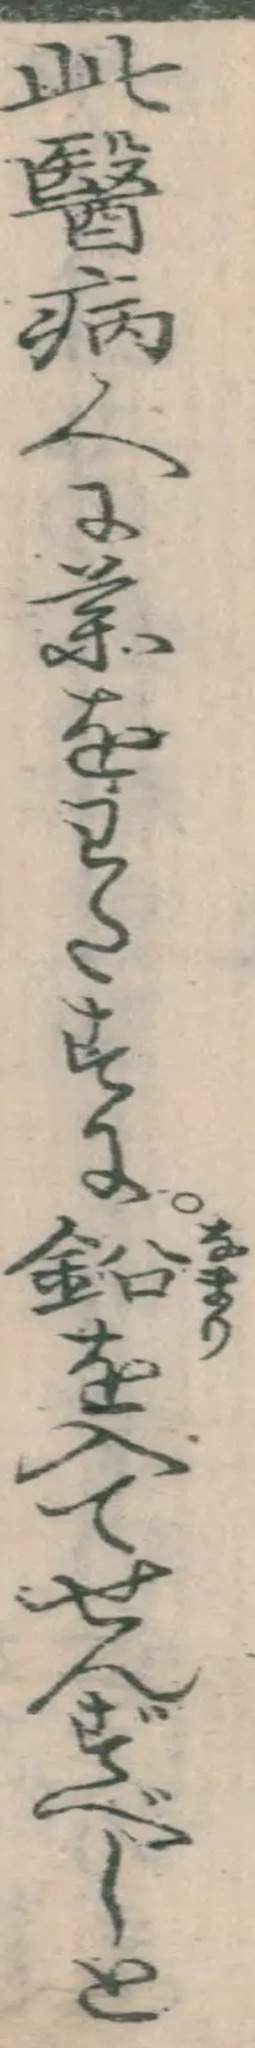此醫病人に藥をわたすに。鉛を入てせんずべしと
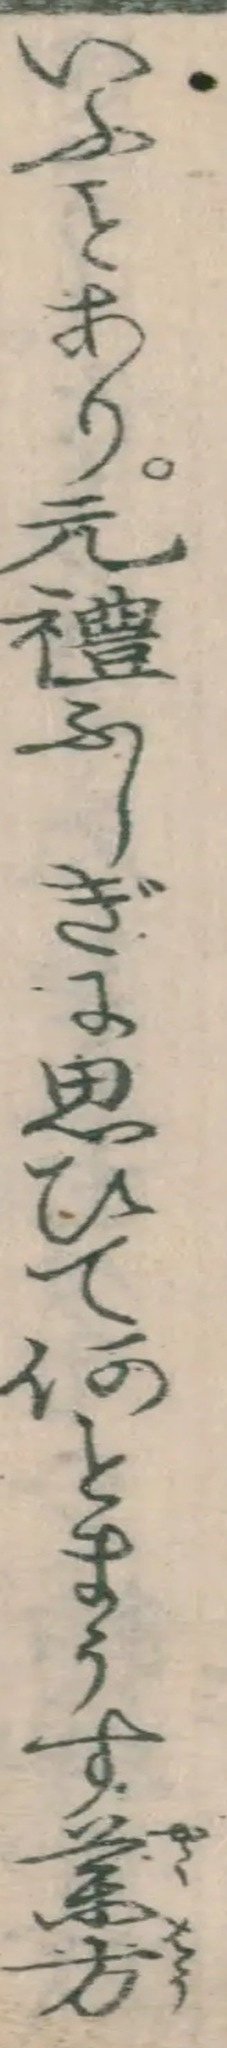いふことあり。元禮ふしぎに思ひて何とまうす藥方
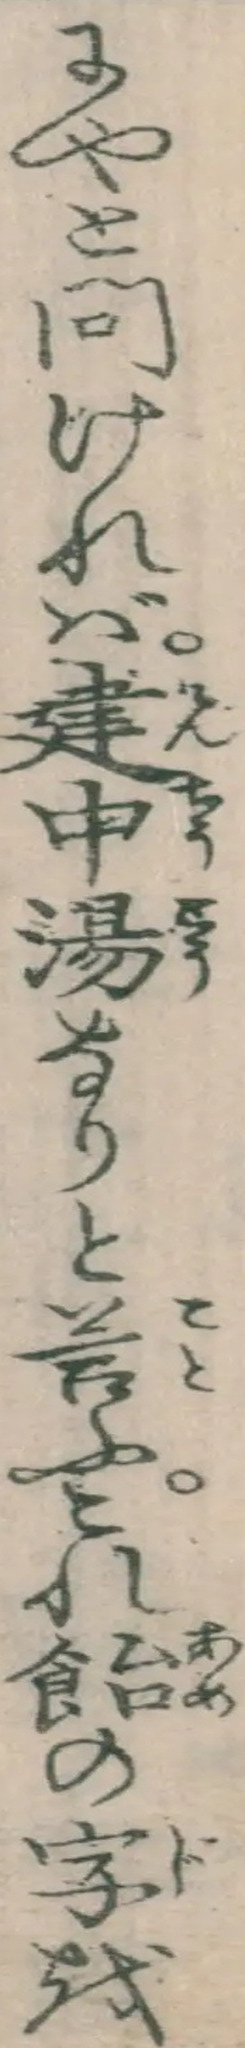にやあと問ければ。建中湯なりと言ふ。これ飴の字を

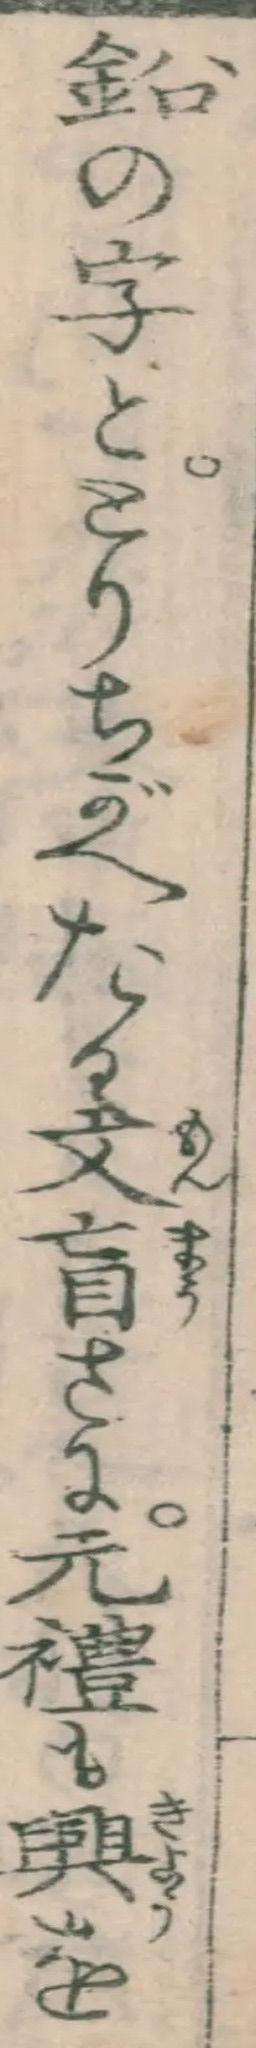鉛の字と。とりちがへたる文盲さに。元禮も興を
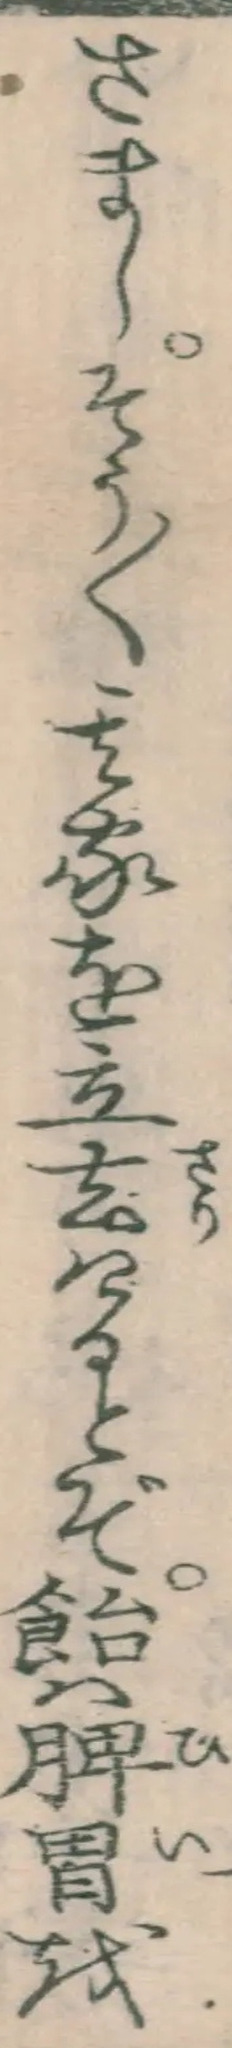さまし。そう〳〵其家を立去たるとぞ。飴は脾胃を
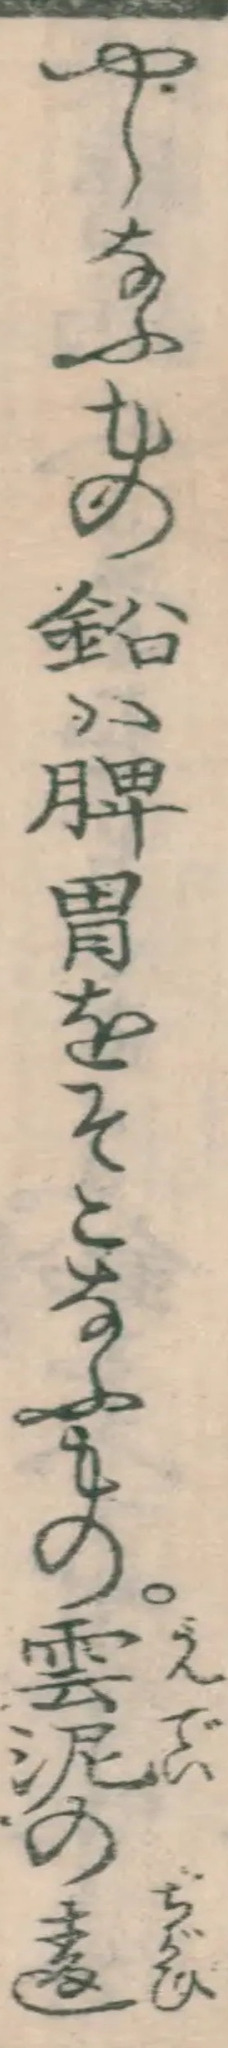やしなふもの鉛は脾胃をそこなふもの。雲泥の違
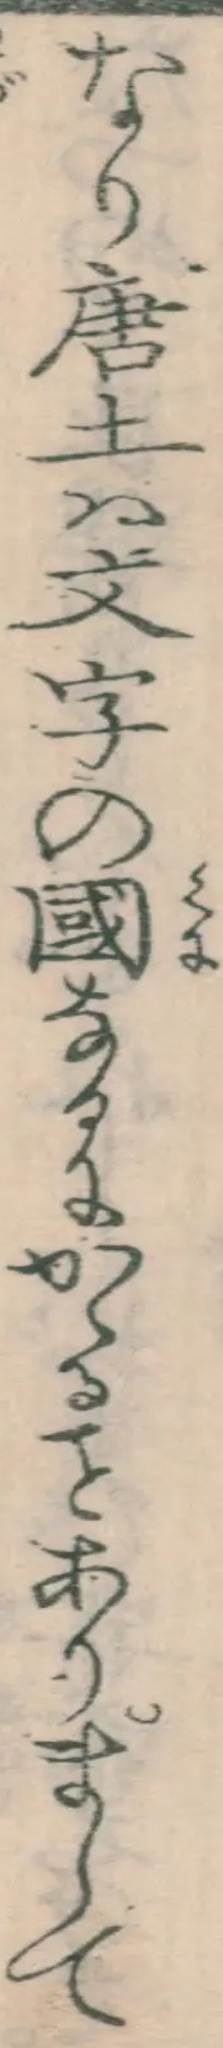なり唐土は文字の國なるにかゝることあり。まして
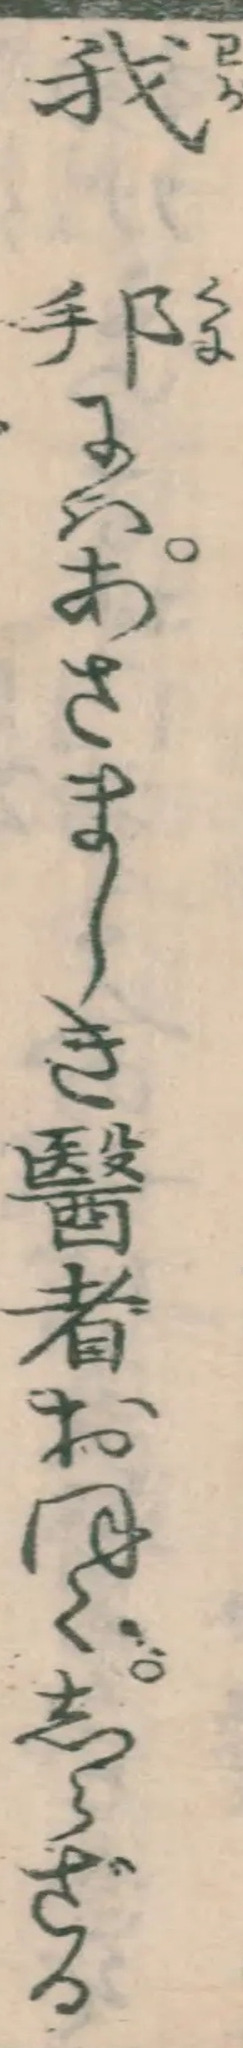我邦には。あさましき醫者おほく。しらざる
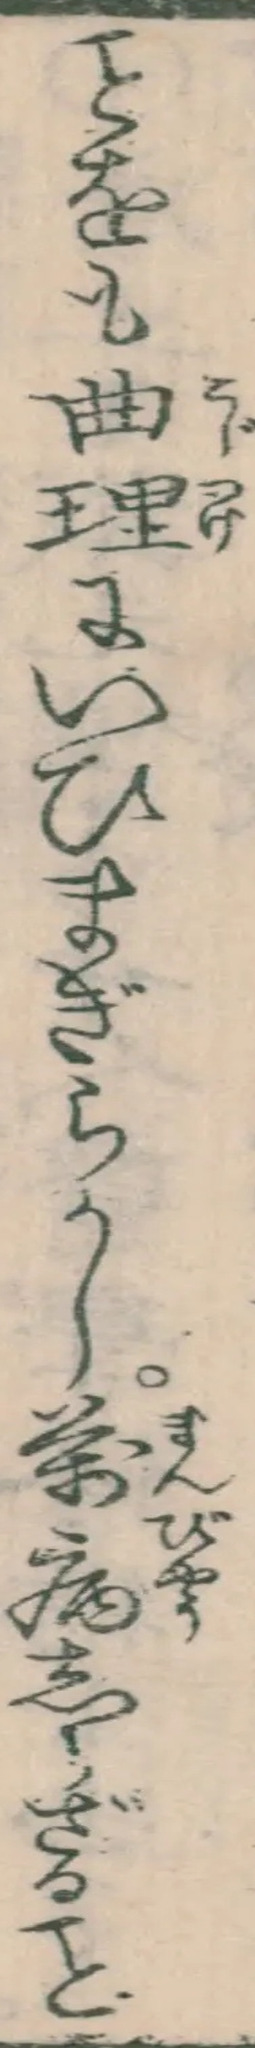ことおも曲理にいひまぎらかし。萬病しらざること
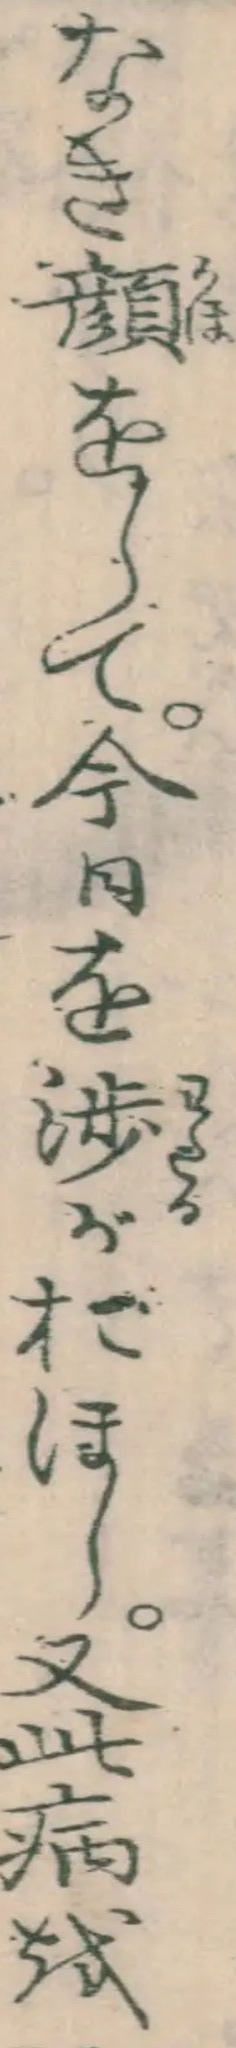なき顔をして。今日を渉がおほし。又此病を
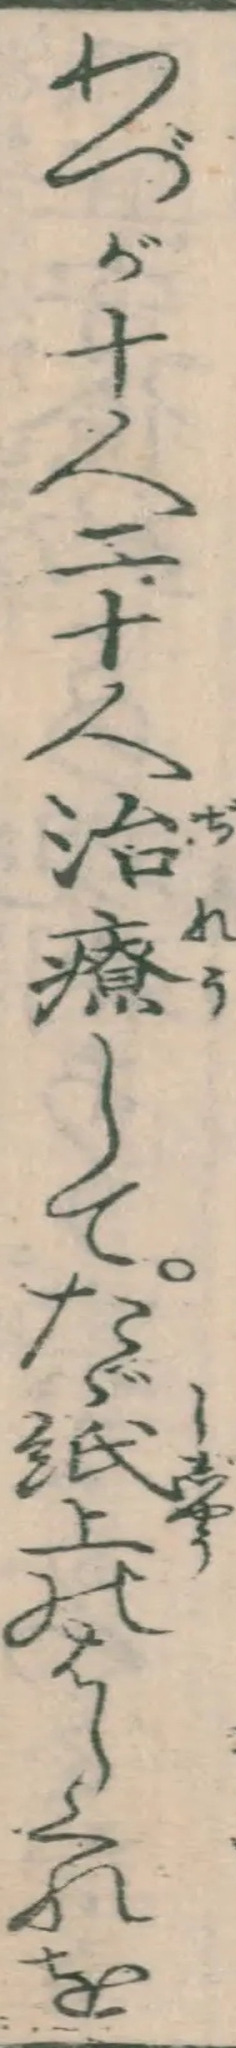わづが十人二十人治療して。たゞ紙上のはしくれを
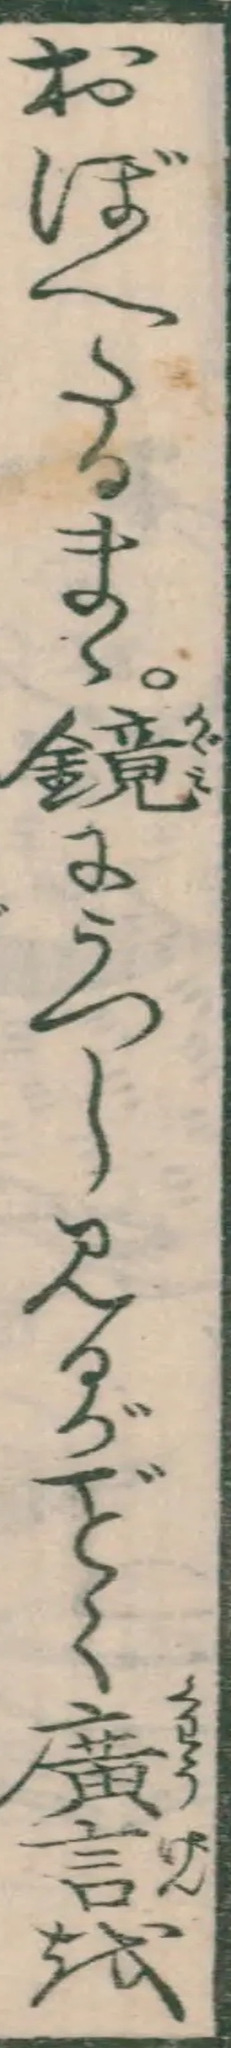おぼへたるまゝ。鏡にうつし見るがごとく廣言を
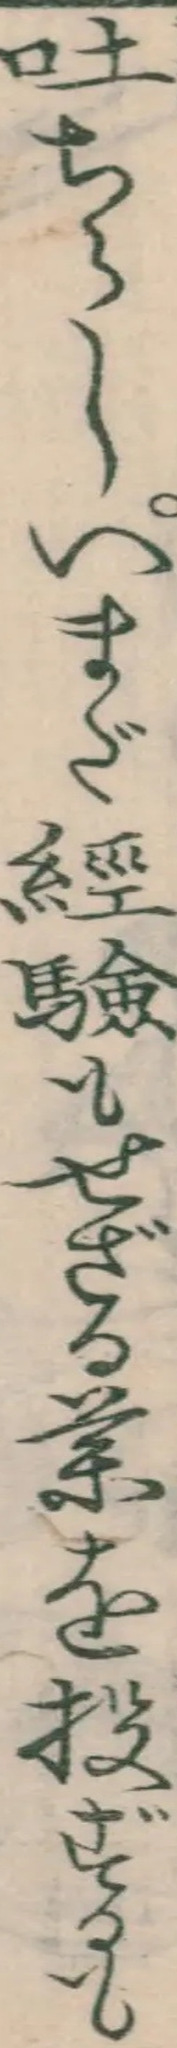吐ちらし。いまだ經験もせざる藥を投ずるも
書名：瘡家示訓
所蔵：国立国会図書館 National Diet Library, JAPAN
